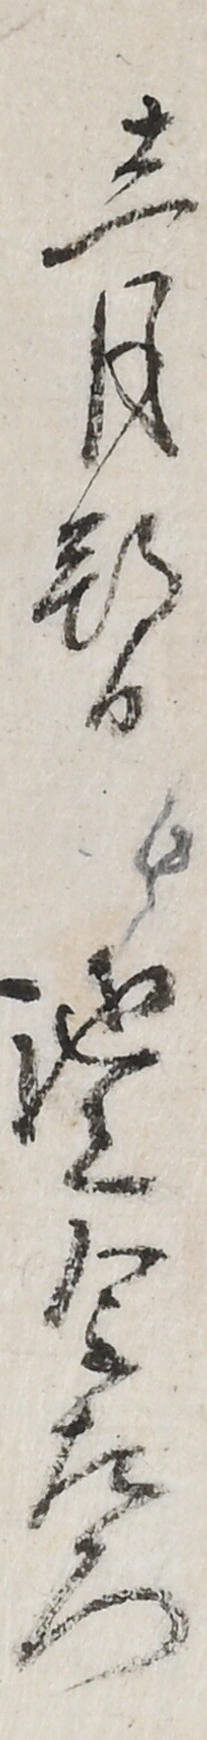十二月朔日池上左衛門
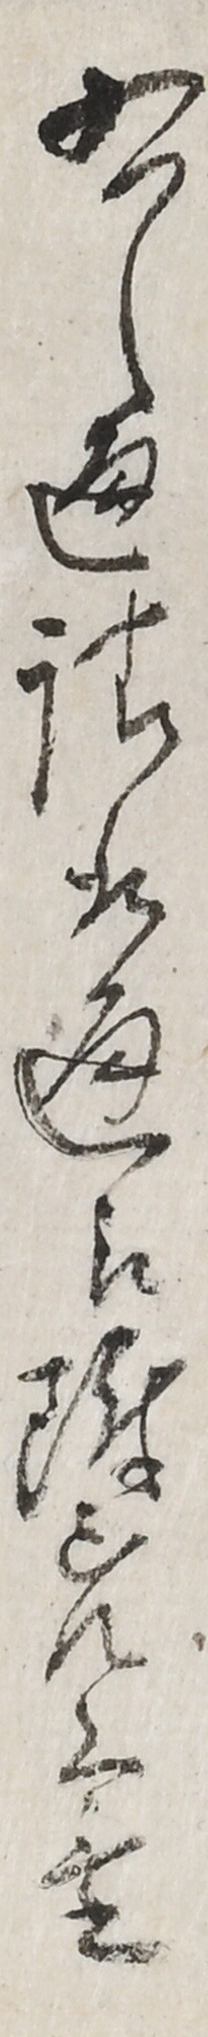右之通請取通江附差上置
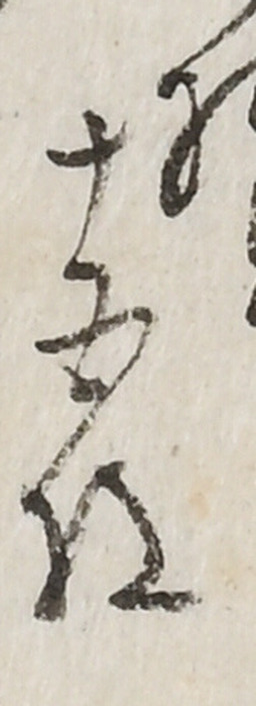十五枚
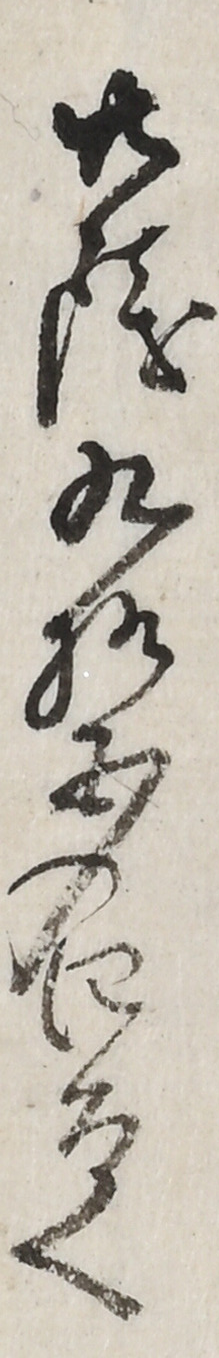此銭九拾五〆四百文
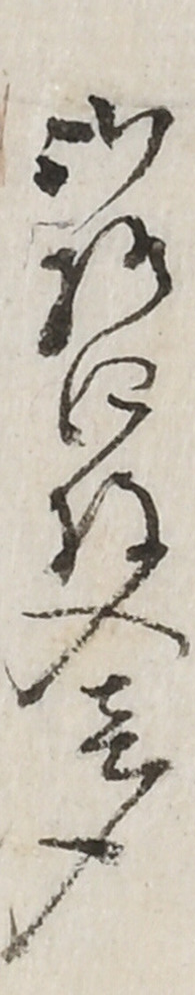弐拾四枚入壱〆
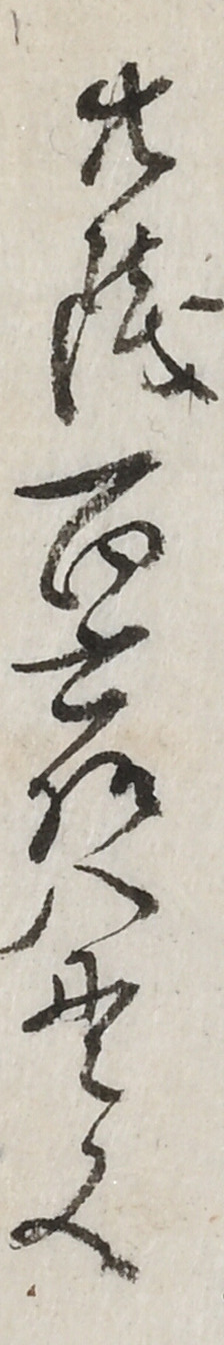此銭百六拾八貫文
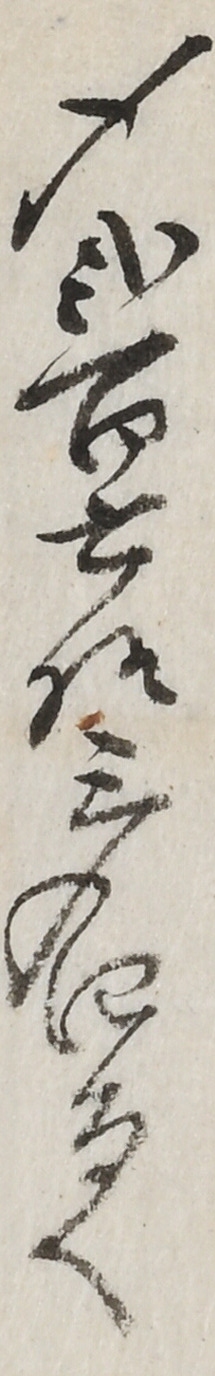〆弐百六拾三〆四百文
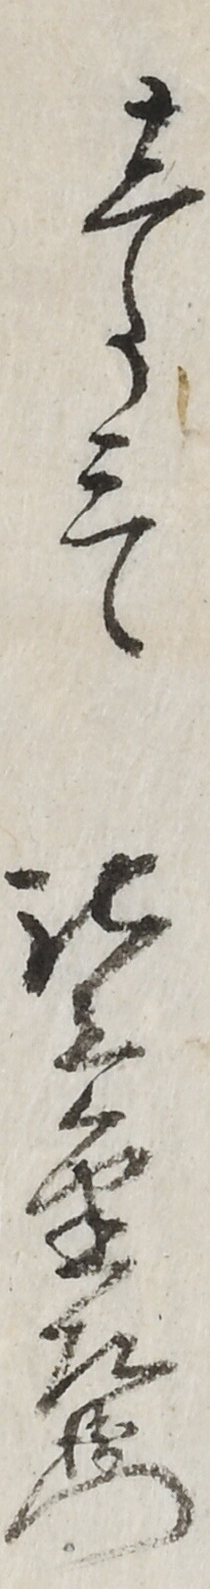十二月三日池上金左衛門
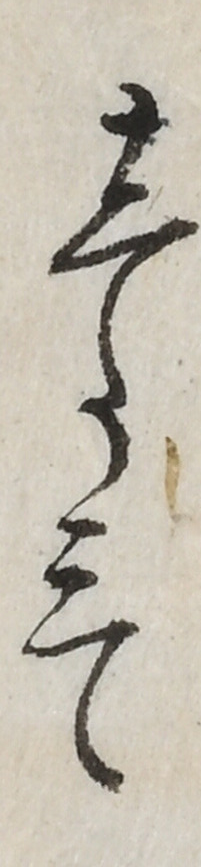十二月月番

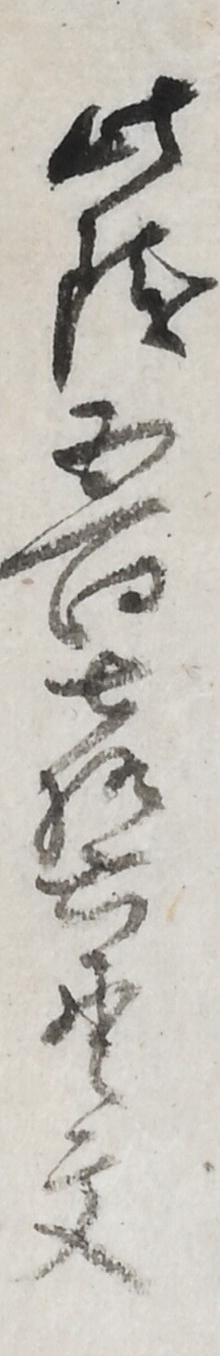此銭五百七拾六貫文
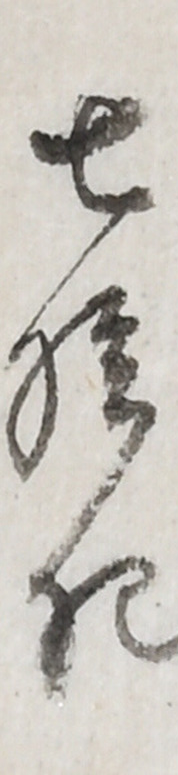七拾把
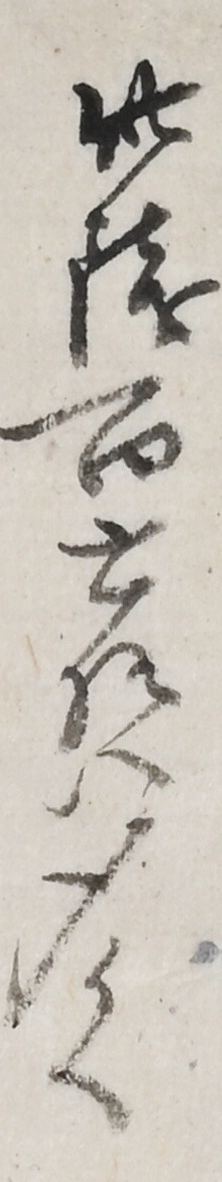此銭百六拾八〆文
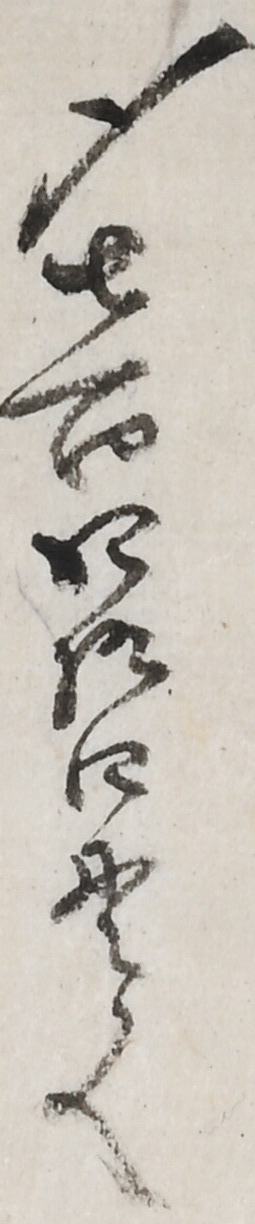〆七百四拾四貫文
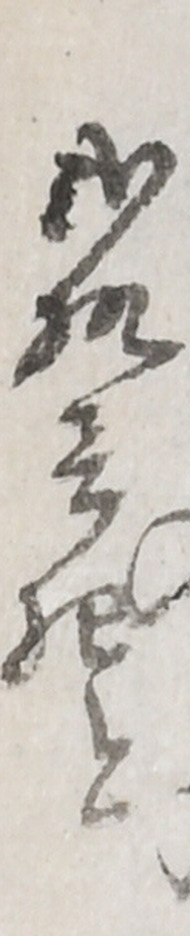弐拾壱把と
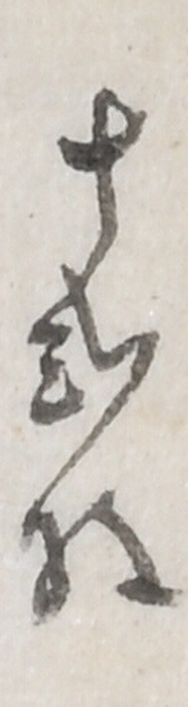十弐枚
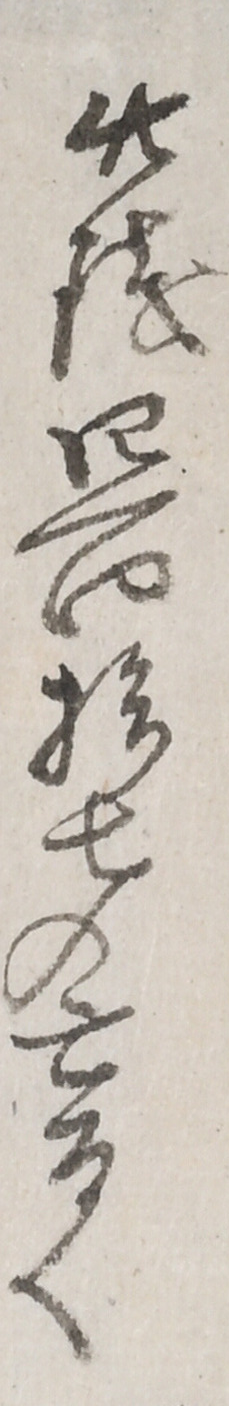此銭四百拾七〆六百文
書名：信濃全國楮幣引換御用控
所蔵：伊那市立高遠町図書館・合同会社AMANE
